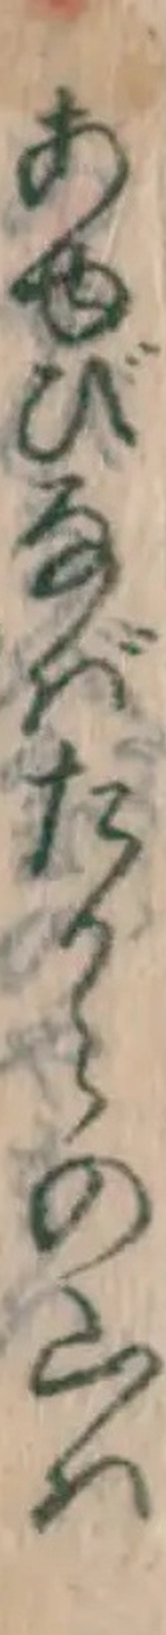あゆびなばたからの山は
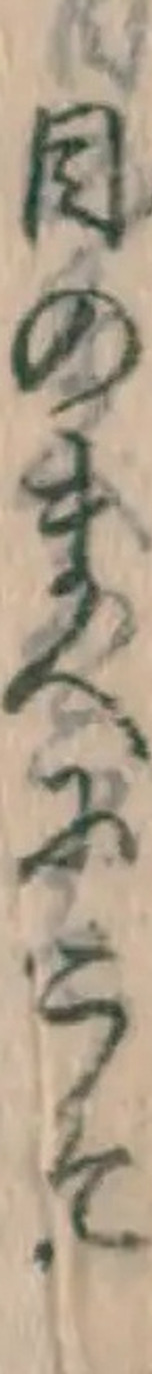目のまへにこそ

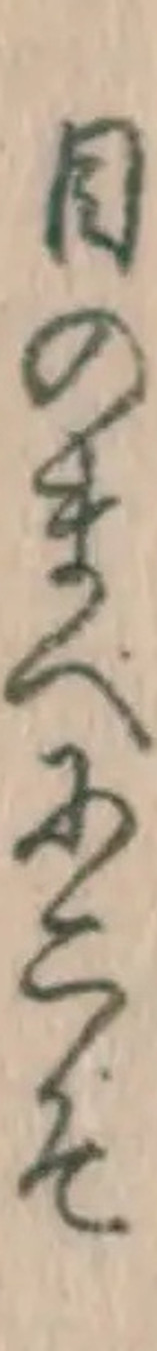目のまへにこそ
